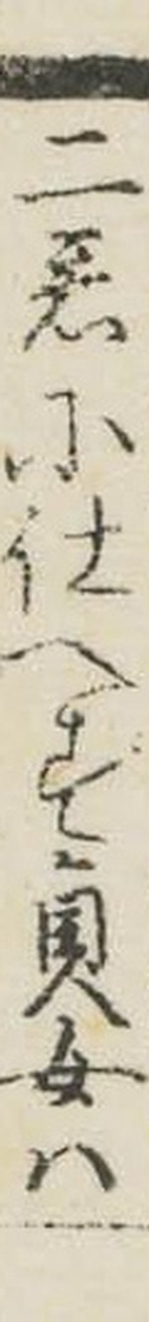二君に仕へず貞女は
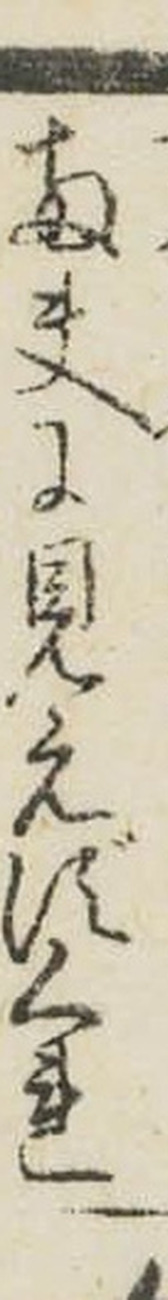両夫に見えずくれ
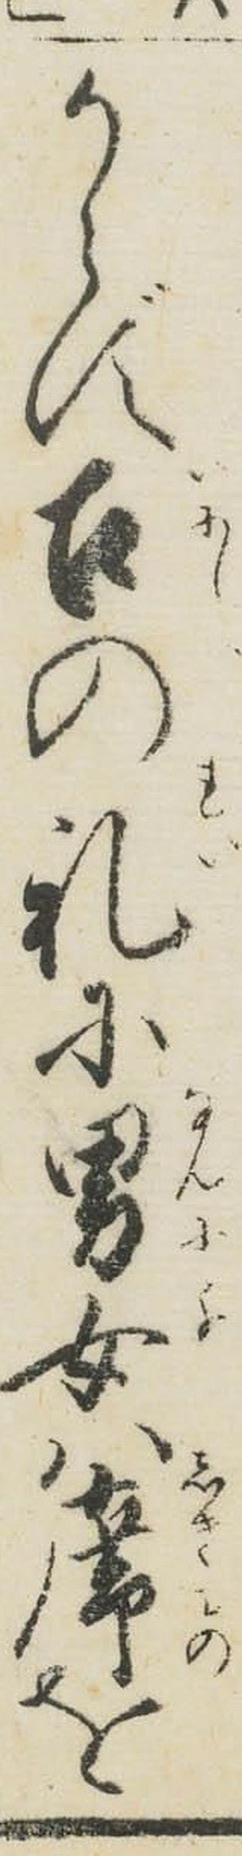からず古の礼に男女は席を
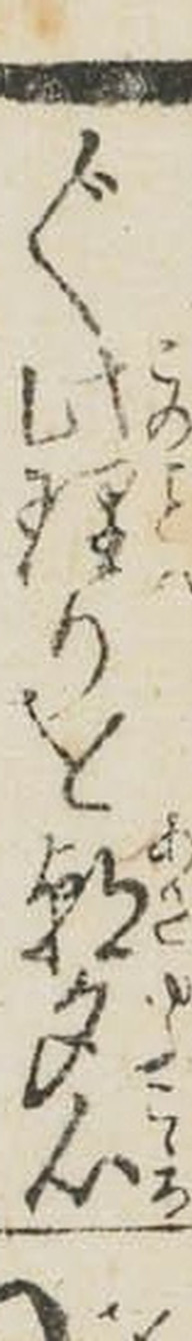〴〵此理りを朝夕心
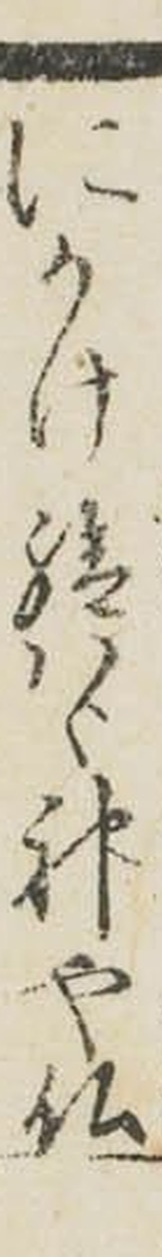にかけ給はゞ神や仏
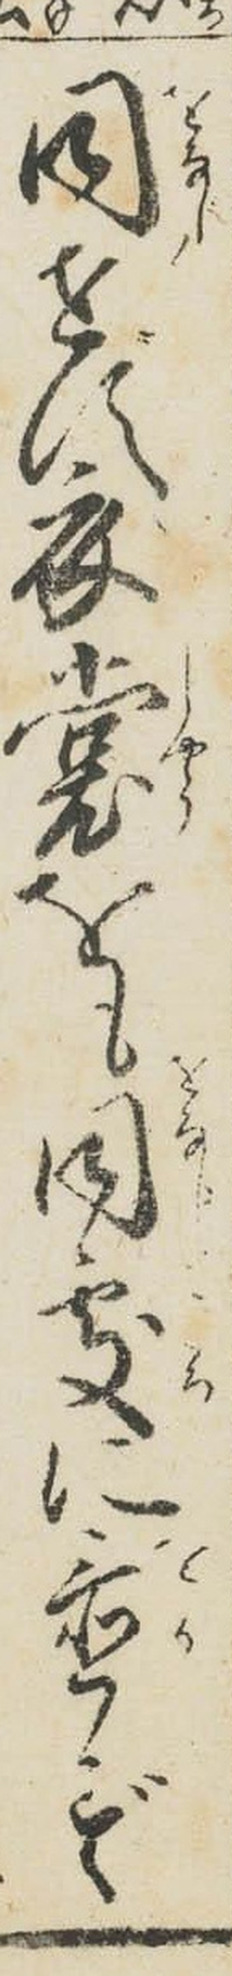同せず衣裳をも同處に置ず
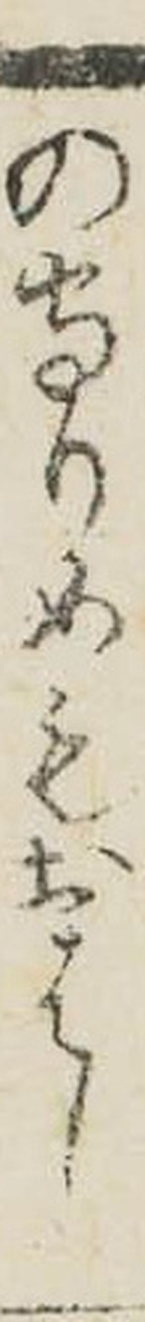の守りめもおはし
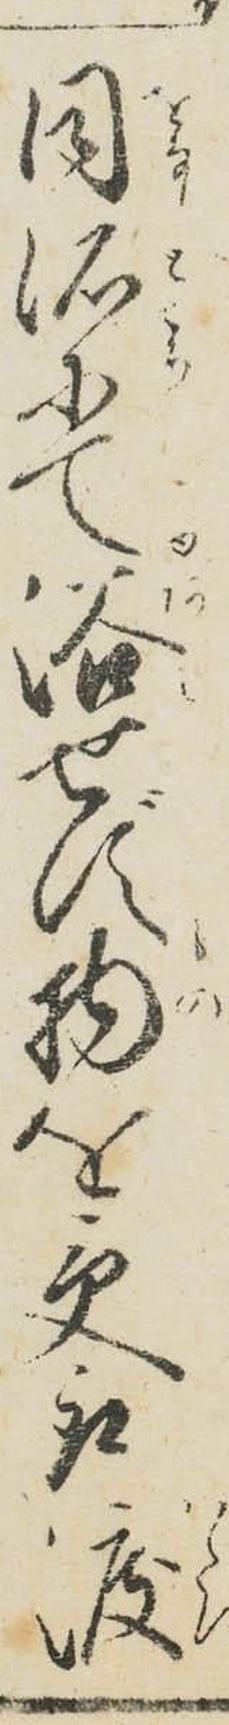同所にて浴せず物を受取渡
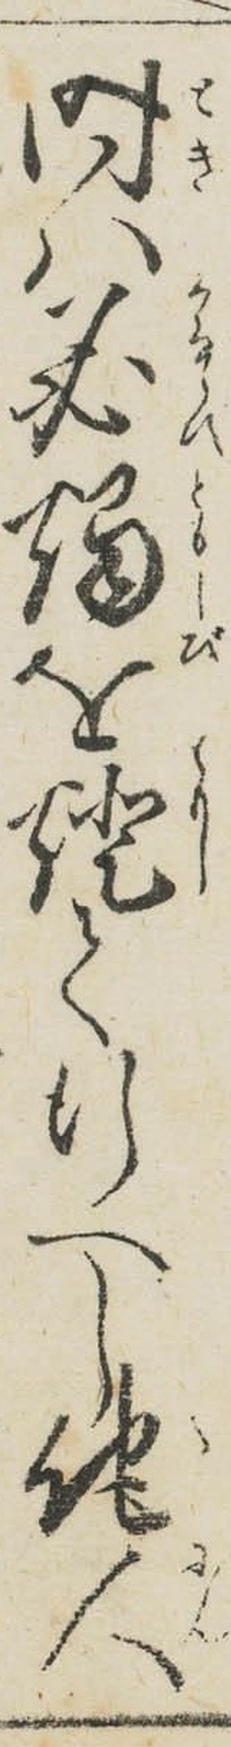時は必燭を燈て行へし他人
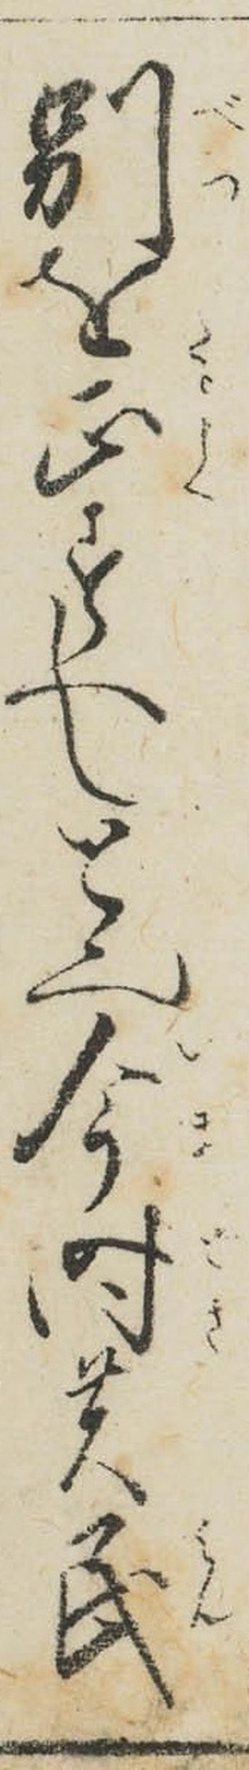別を正すへしと也今時の民
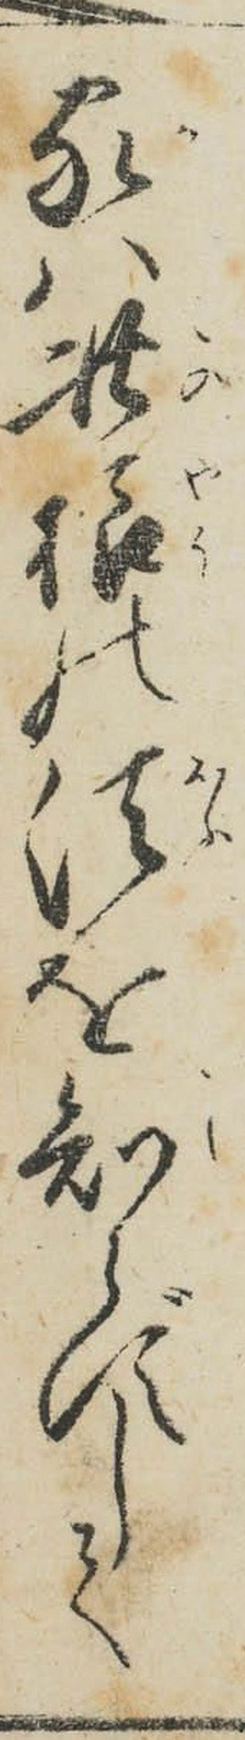家は此様の法を知らずして

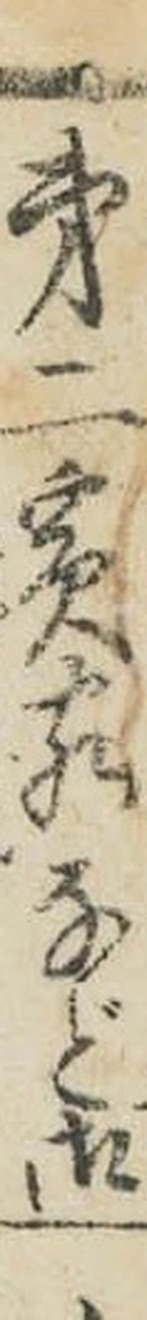第二賓客など御
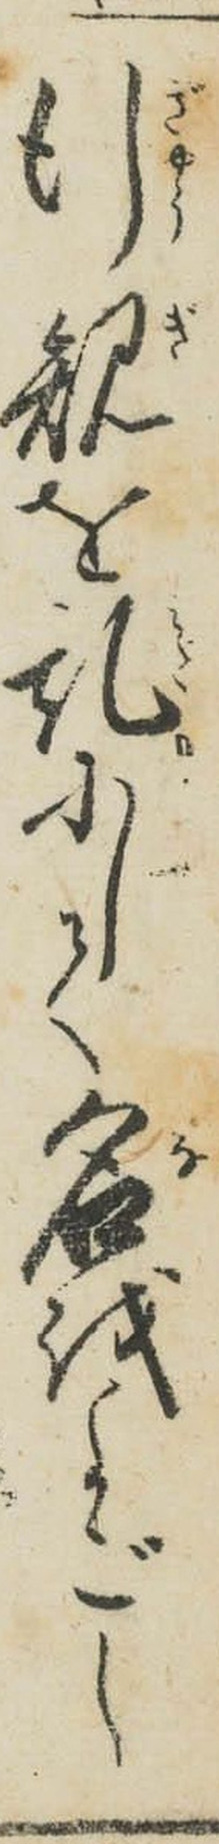行規を乱にして名をよごし
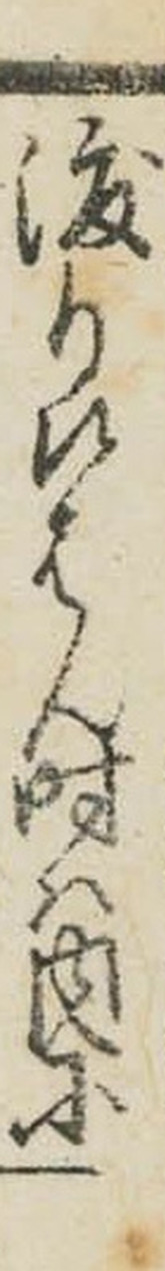渡り候はん時は内に
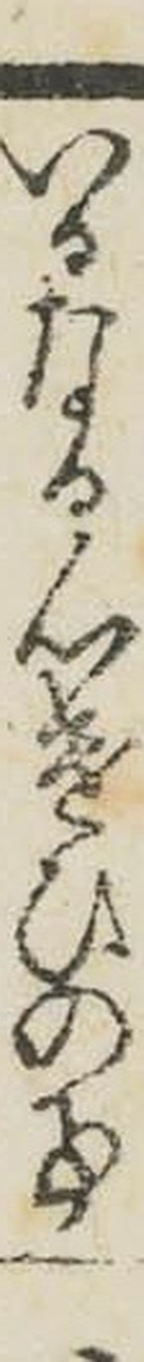いかなる心遣ひの事
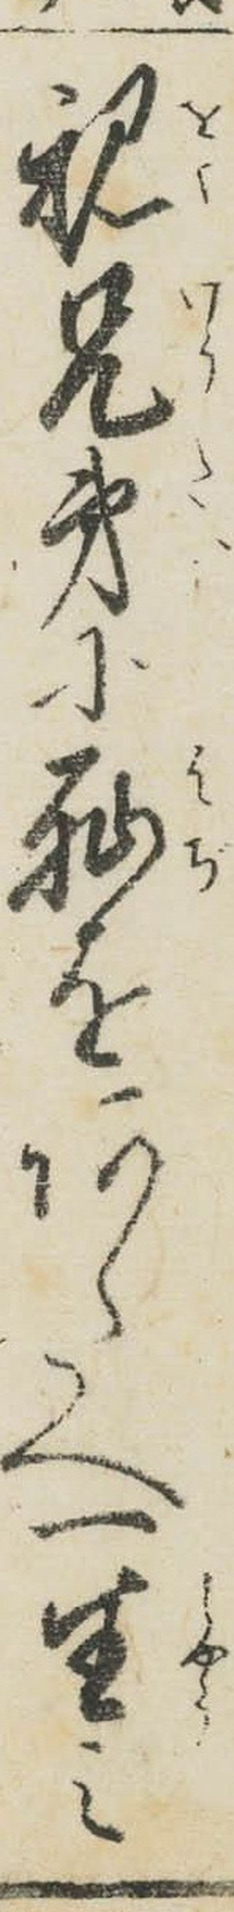親兄弟に恥をあたへ一生み
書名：女大学
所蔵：東京学芸大学教育コンテンツアーカイブ
